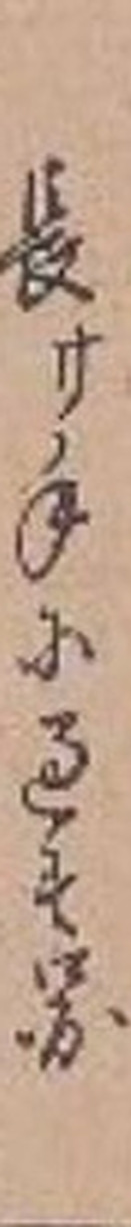長さ手に過す図
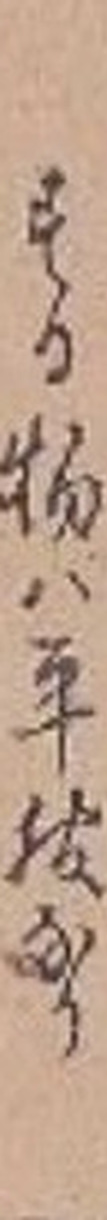する物は平服なり
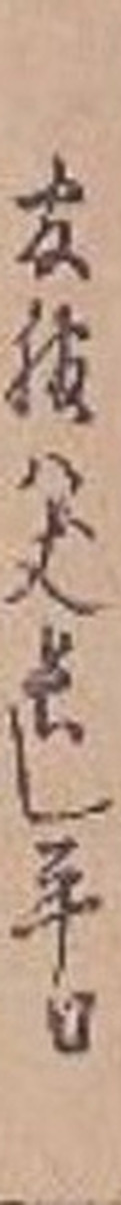官服は丈長し平日
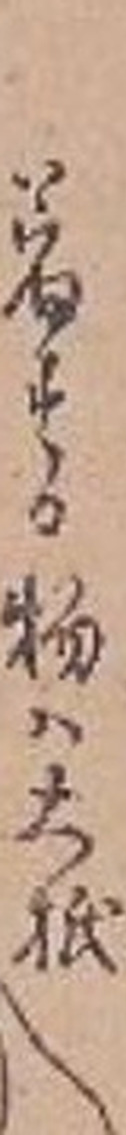着する物は大抵
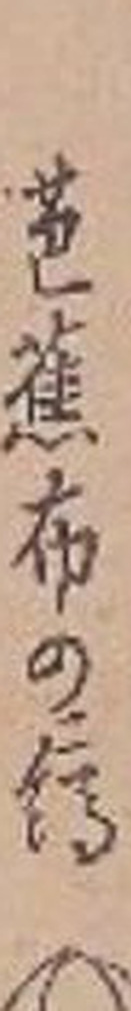芭蕉布の縞
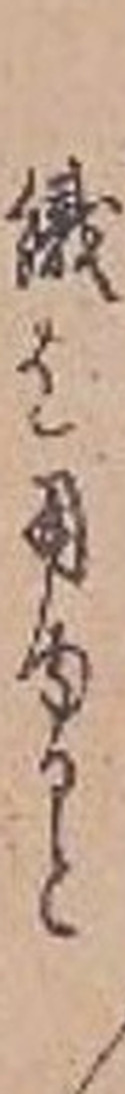織を用ゆると
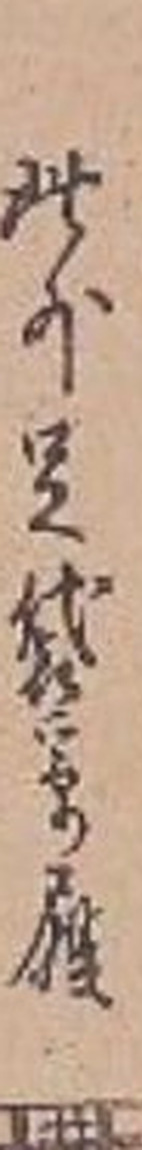此外足袋草履
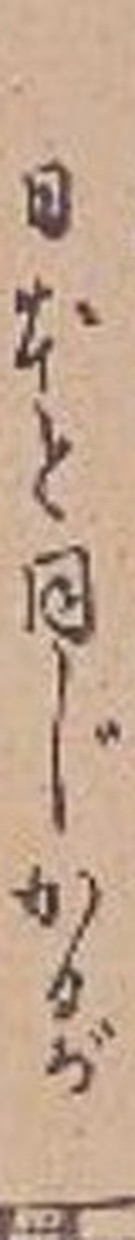日本と同じかるが
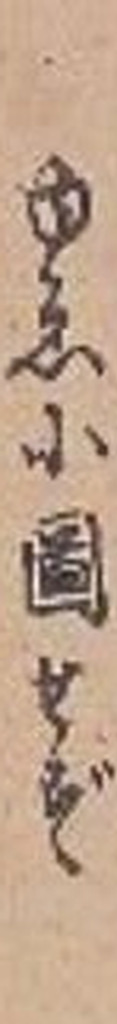ゆゑに図せず
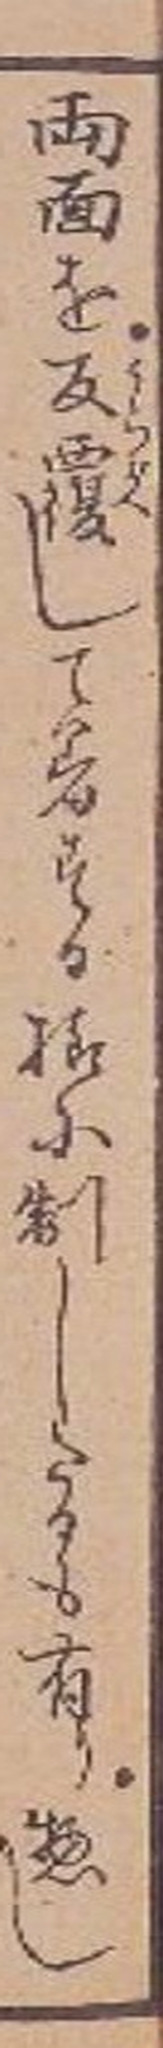両面を•反覆して着する様に制したるも有り•惣し
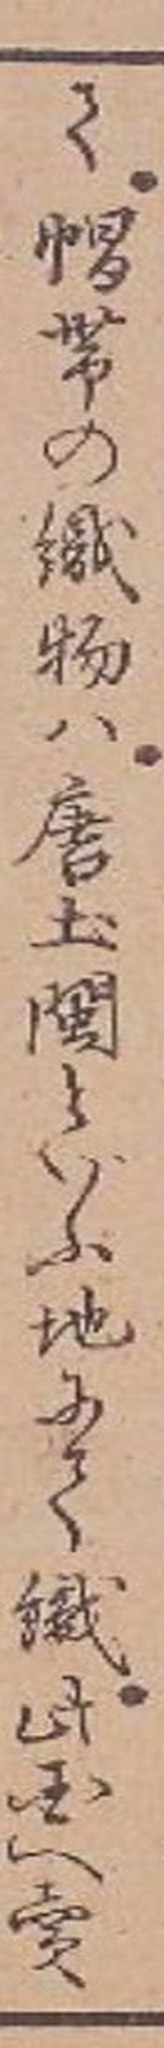て•帽帯の織物は•唐度閩といふ地にて織•此国へ売
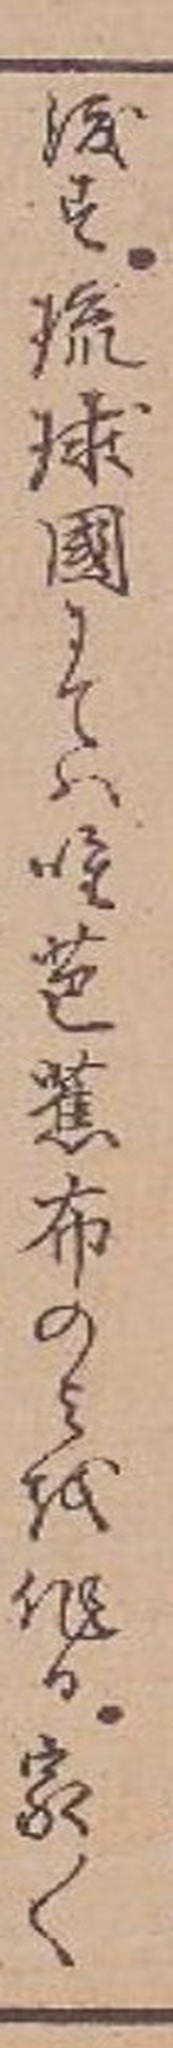渡す•琉球国にては唯芭蕉布のみを作る•家〳〵
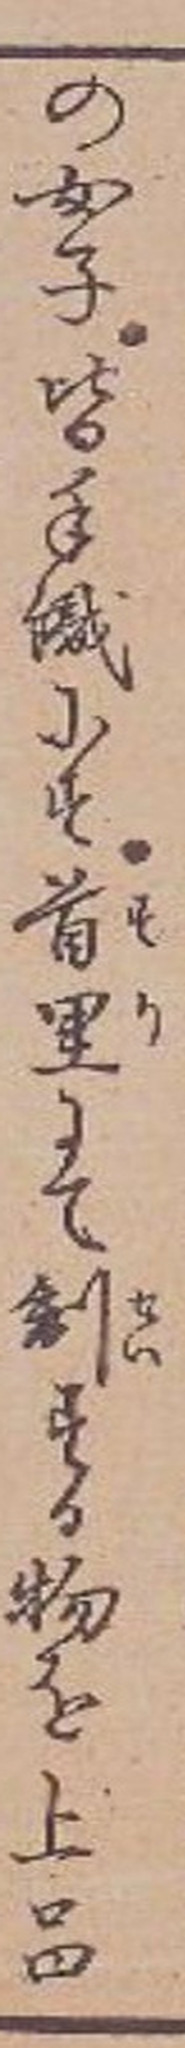の女子•皆手織にす•首里にて制する物を上品
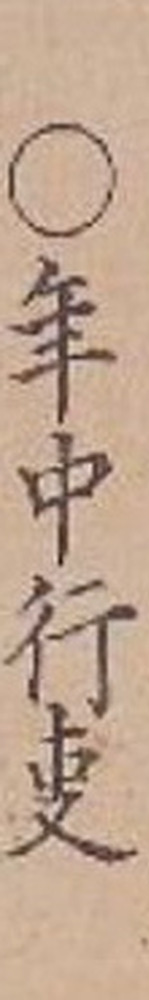〇年中行事
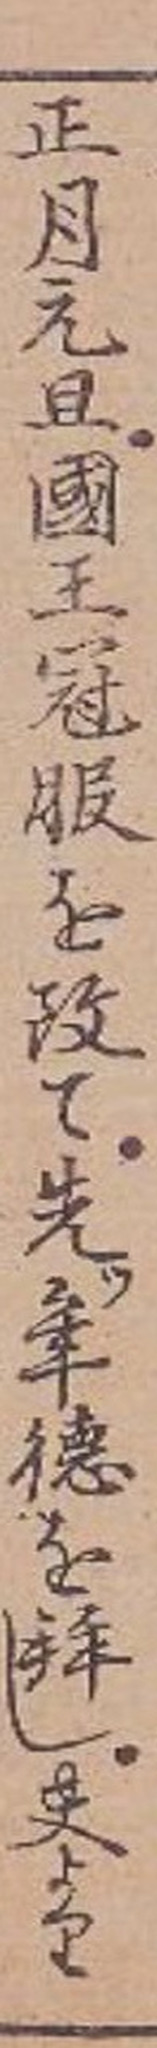正月元旦•国王冠服を改て•先つ年徳を拝し•夫より
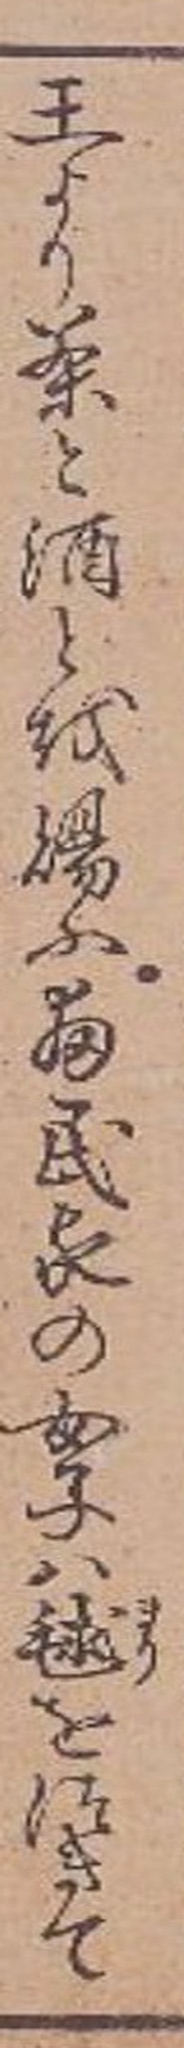王より茶と酒とを賜ふ•扨民家の女子は毬をつきて
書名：琉球談
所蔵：University of the Ryukyus Library
